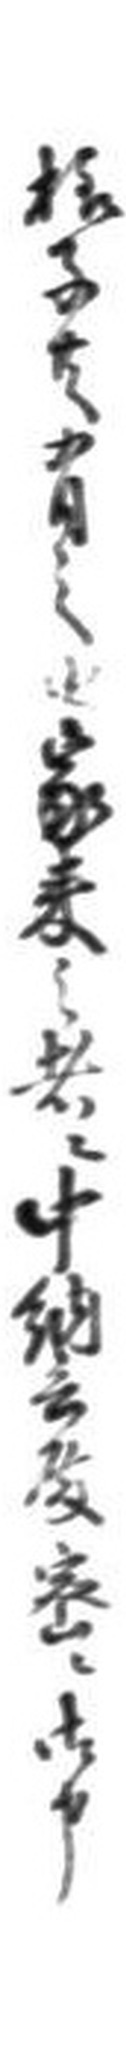様子共有之由家来之者ニ中納言殿密ニ御申
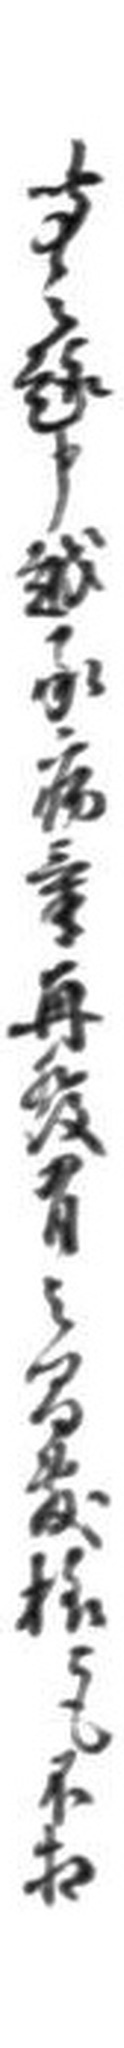聞候趣申越承病気再発有之間敷様ニも不相
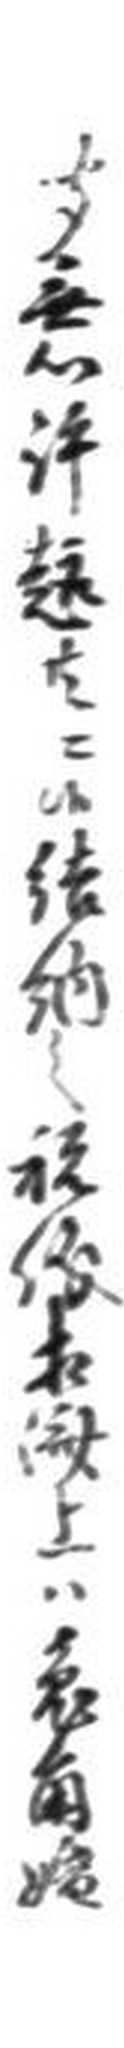聞無心許趣共ニ候結納之祝儀相済上ハ兎角婚
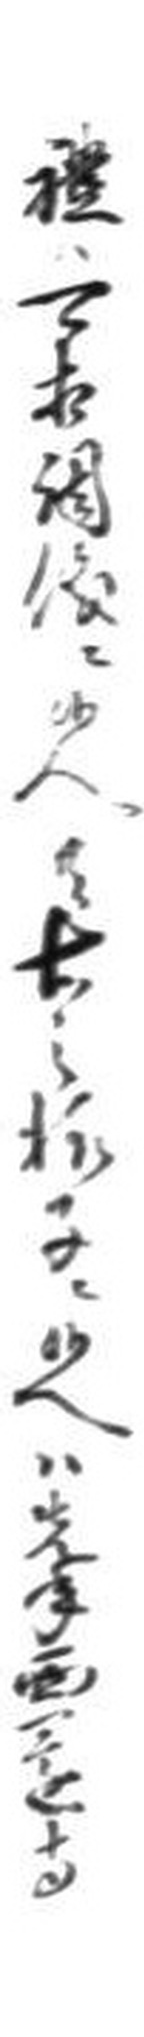礼ハ可相調儀ニ候へ共右之様子ニ候へハ先年西園寺
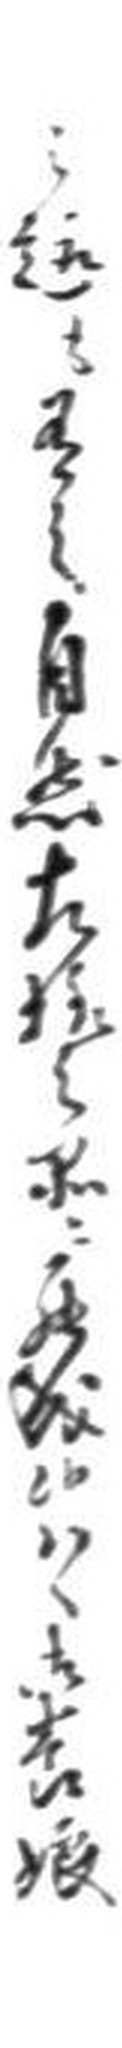之趣も有之自然左様之品ニ罷成候ハヽ御養娘

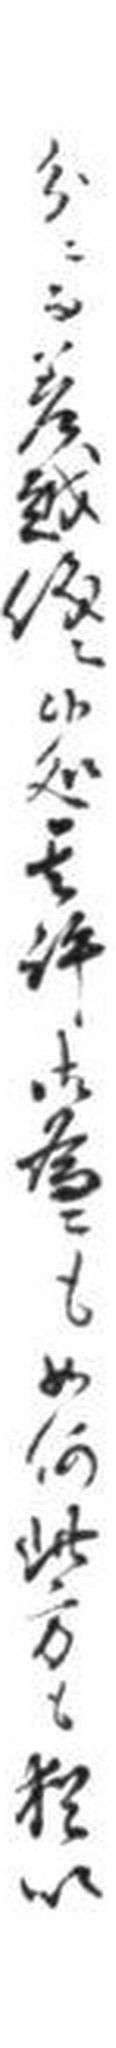分ニ而差越儀ニ候処其許御為ニも如何此方も猶以
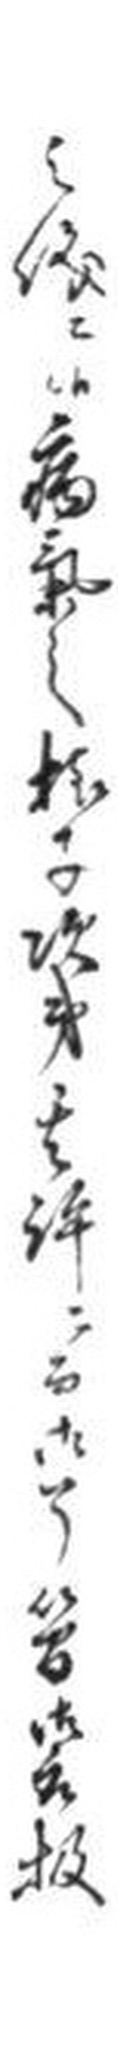之儀ニ候病気之様子次第其許ニ而御了簡御取扱
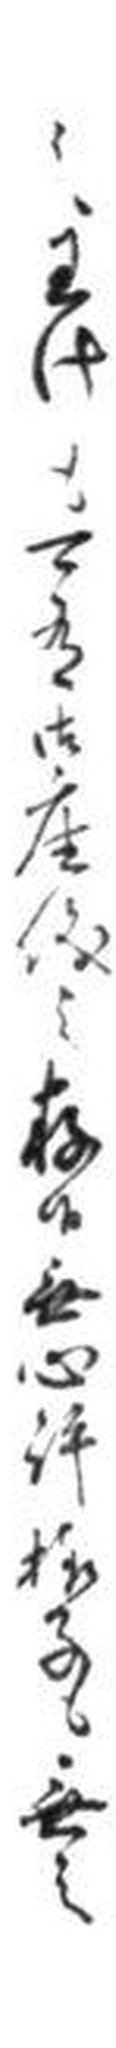之わけも可有御座儀与存候無心許様子も無之
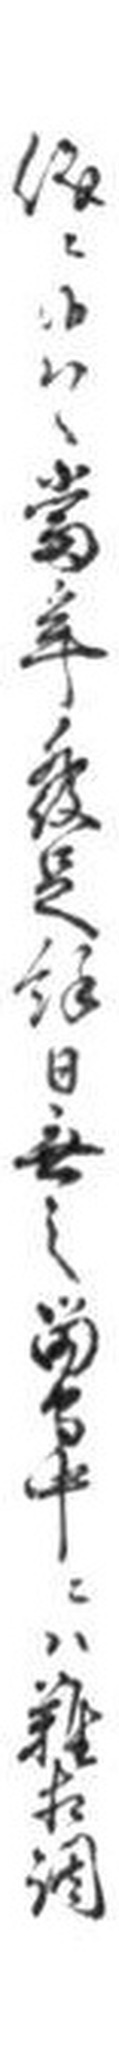儀ニ候ハヽ当年発足余日無之留守中ニハ難相調
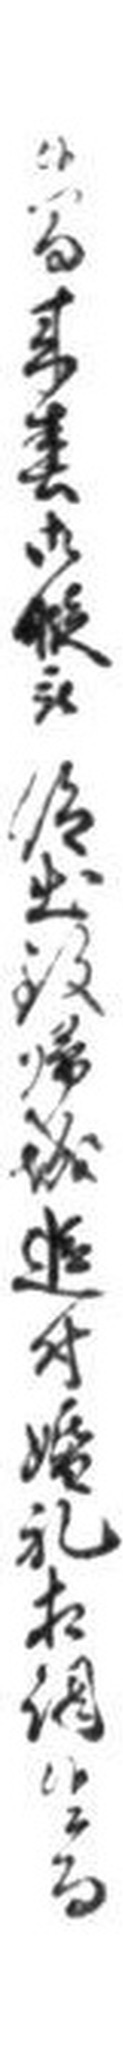候間来春御暇被仰出致帰城追付婚礼相調候ニ而
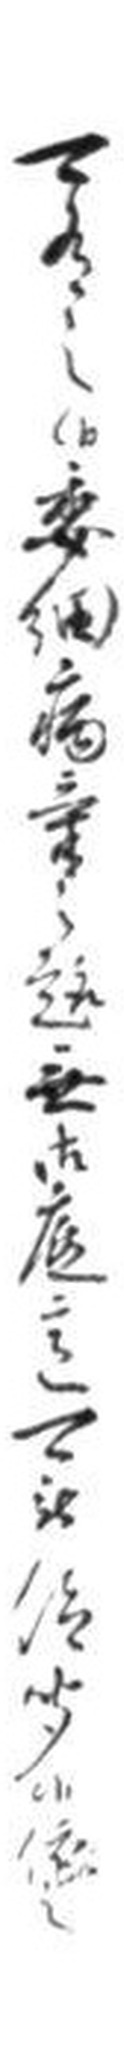可有之候委細病気之趣無御底意可被仰聞候依之
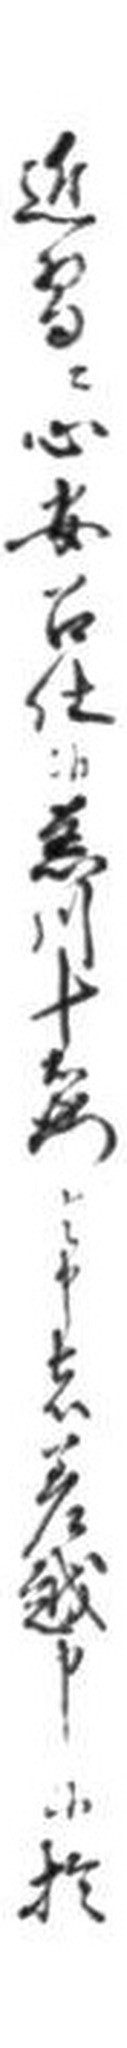近習ニ心安召仕候荒川十右衛門与申者差越申候於
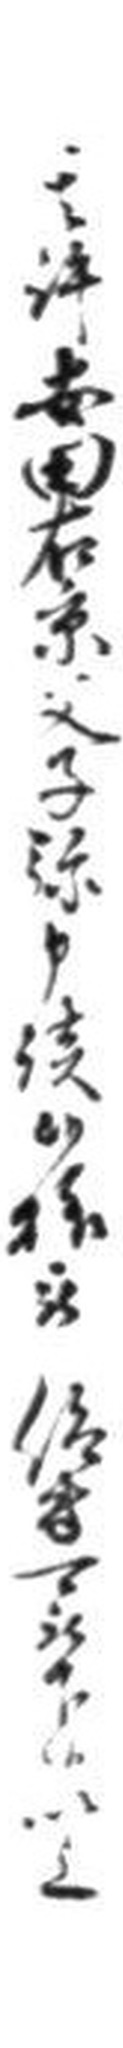其許安田右京父子弥申談候様被仰付可被下候以上
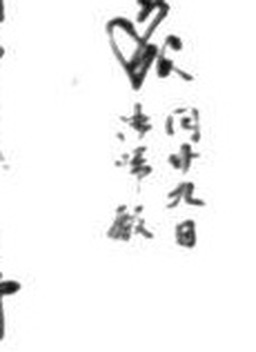御帰殿
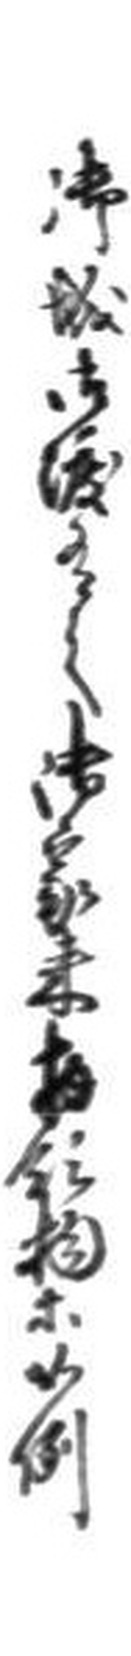御城御渡有之御家来拝領物等如例
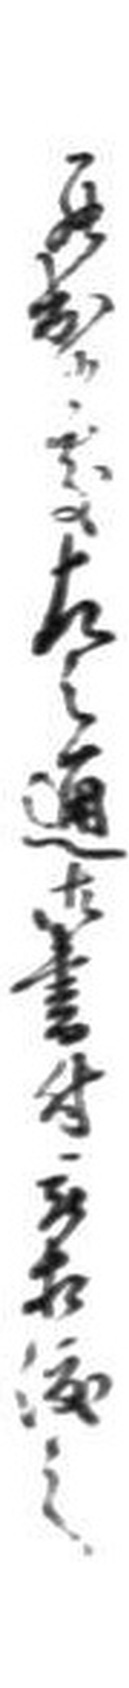罷出候処左之通御書付被相渡之
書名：家譜 二十二 吉品公 従元禄十五年到同十六年
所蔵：福井県文書館 Fukui Prefectural Archives
